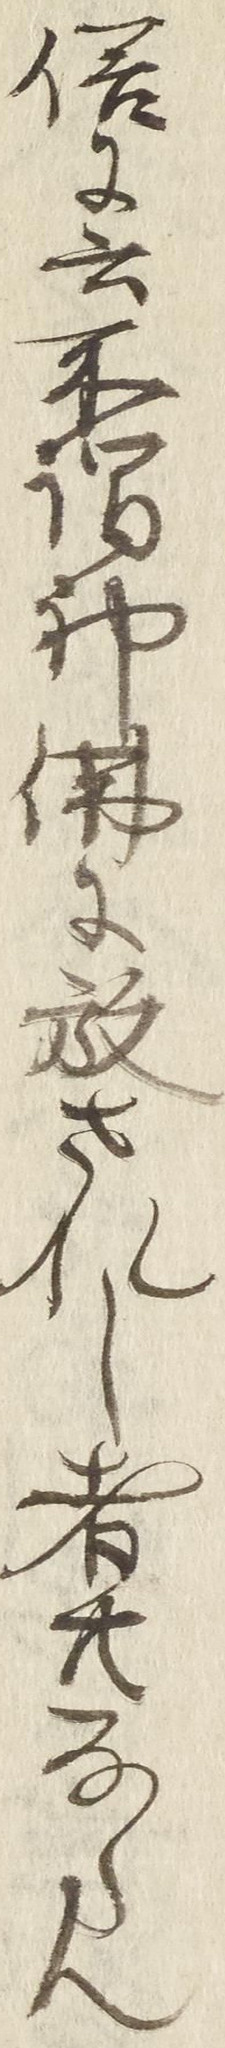俗に云所謂神仏に放されし者共ならん
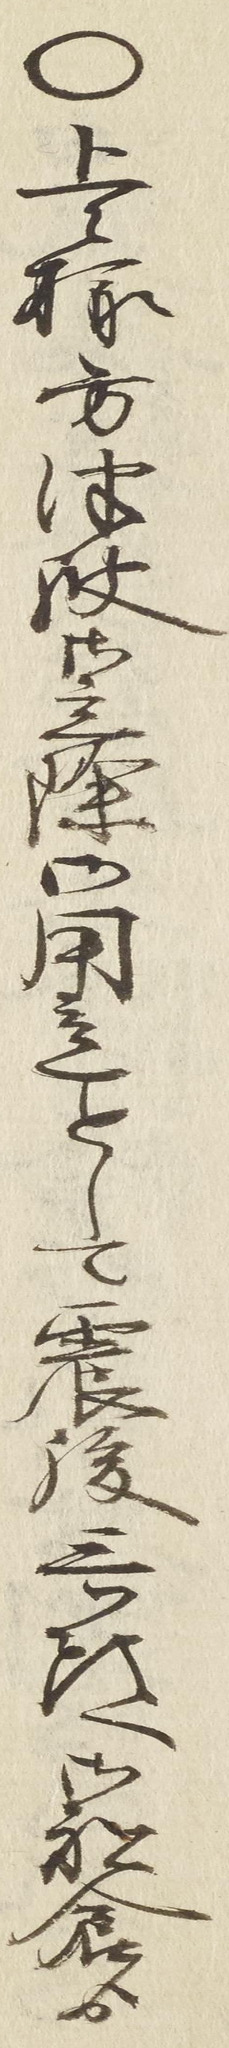〇上様々様方津波御立除御用意として震後三ツ頭へ御船倉より
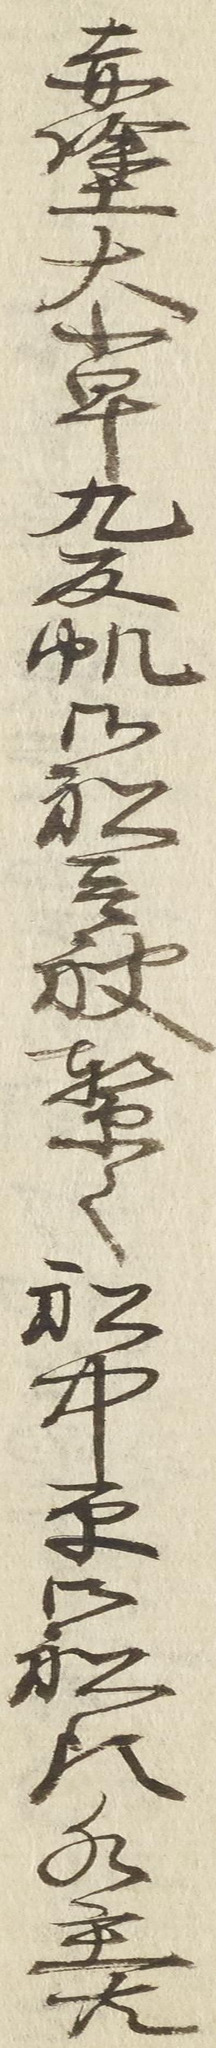赤塗大小早九反帆御船壱艘繋く船中平御船頭水主共
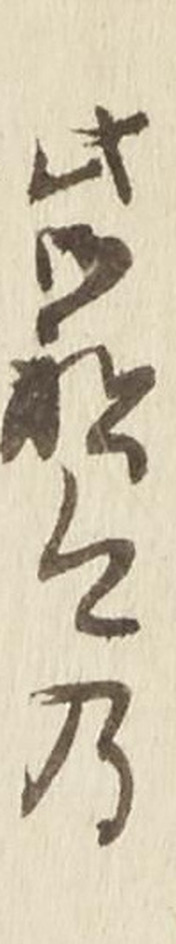此御船今の
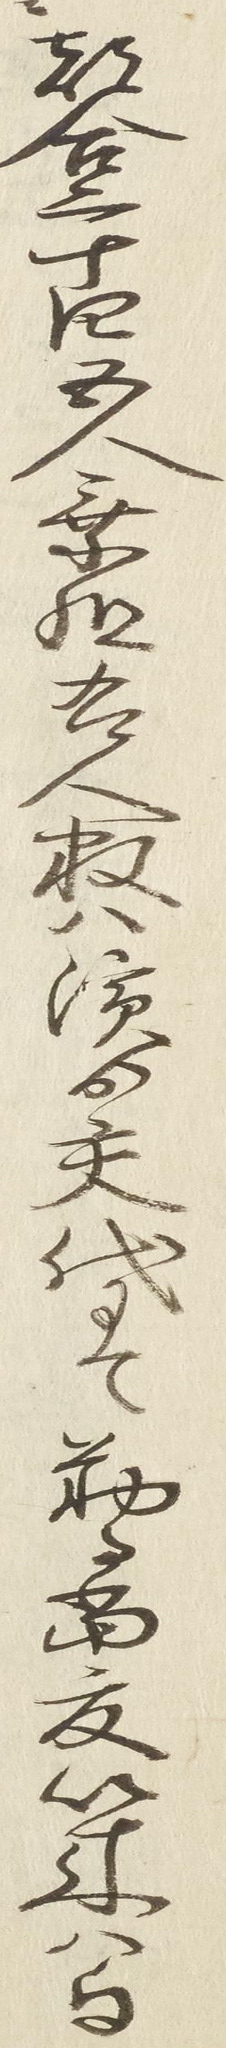都合二十四五人乗組右人数は浜より交代にて勤る当度以来は自
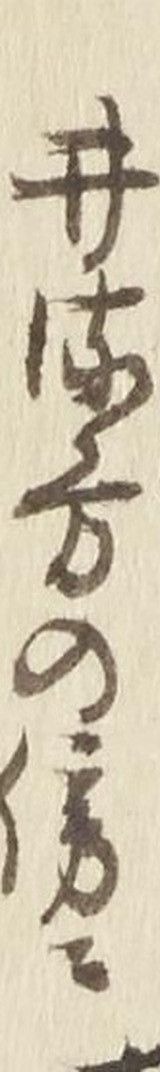井流方の傍に
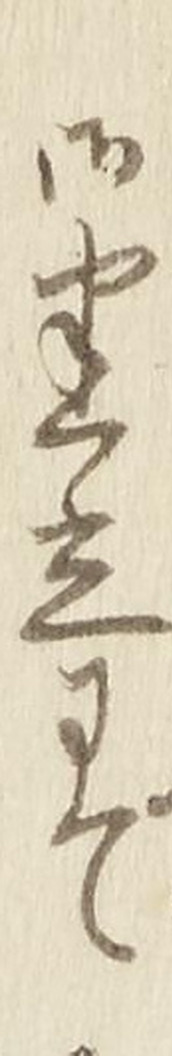御建立にて
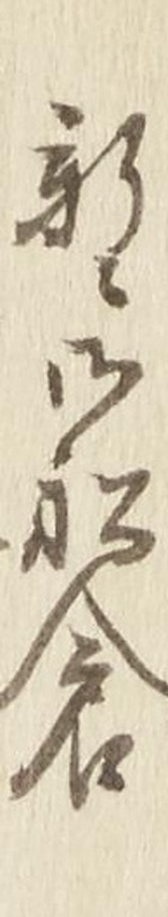新に御船倉
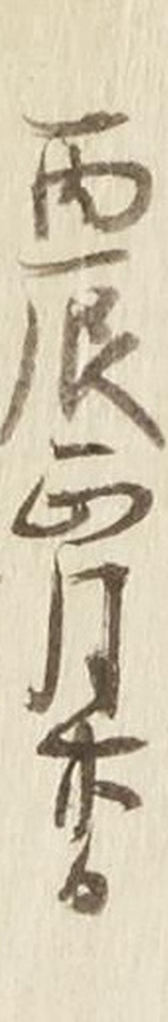丙辰正月廿日
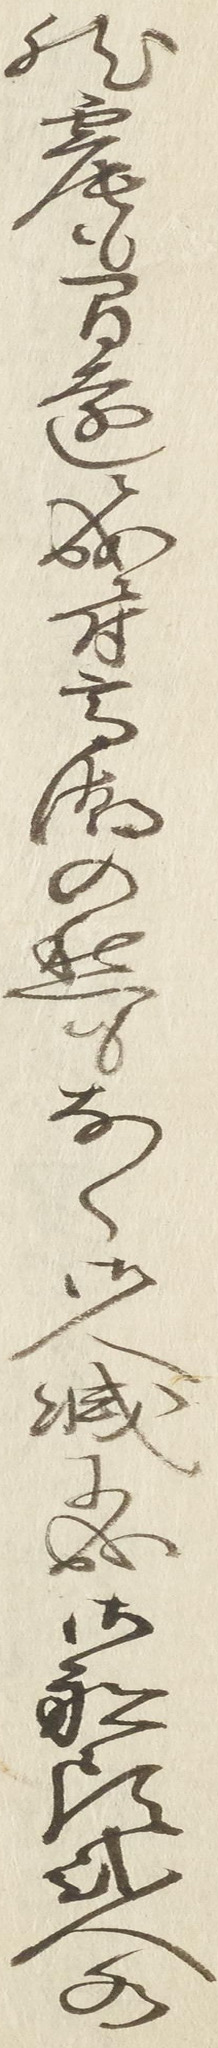然震も間遠に成に付高潮の愁もなく御人減に成御船頭弐人水
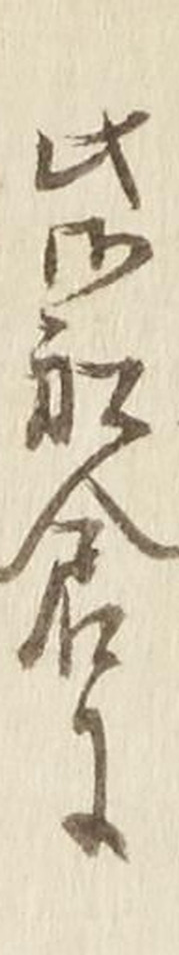此御船倉に
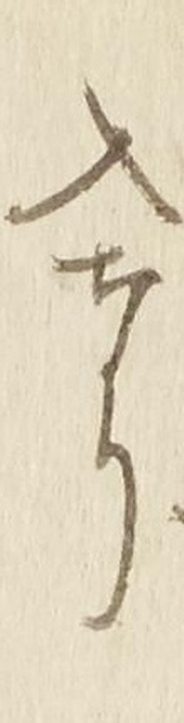入なり
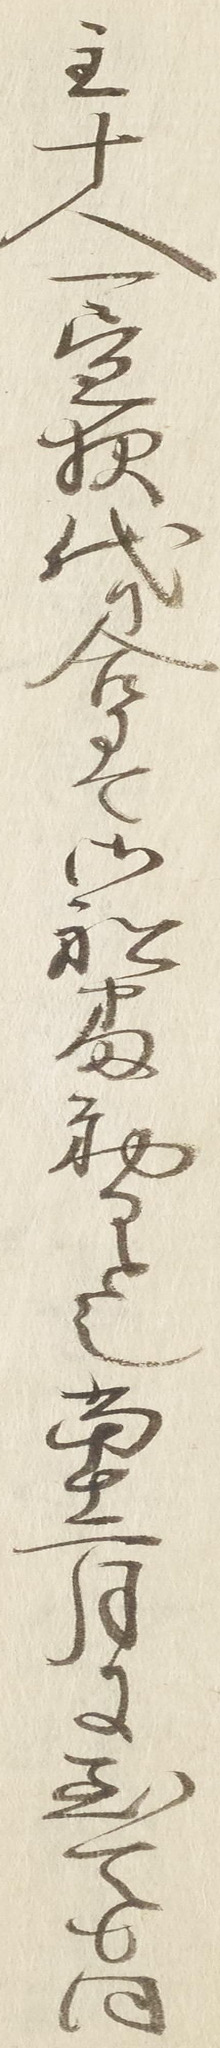主十人一昼夜代り合にて御船番勤ると也当十二月に至ても同
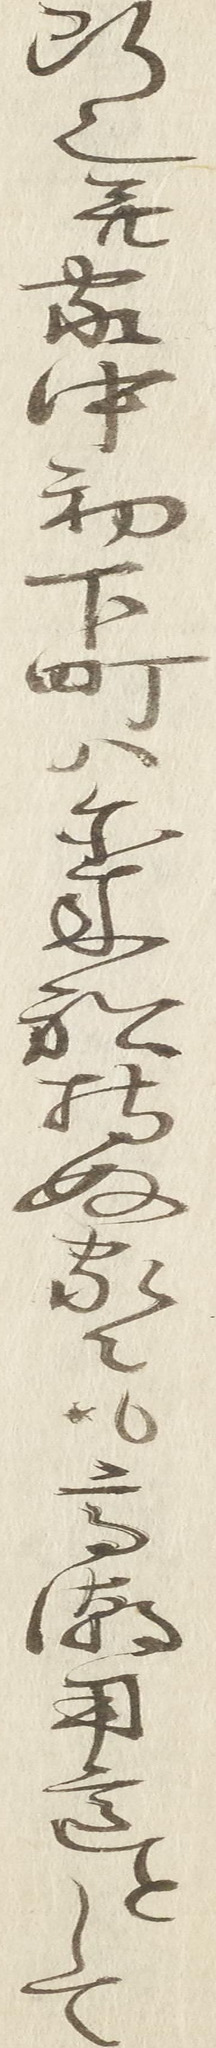断也幷家中初下町は尓来船持ぬ家々も高潮用意として
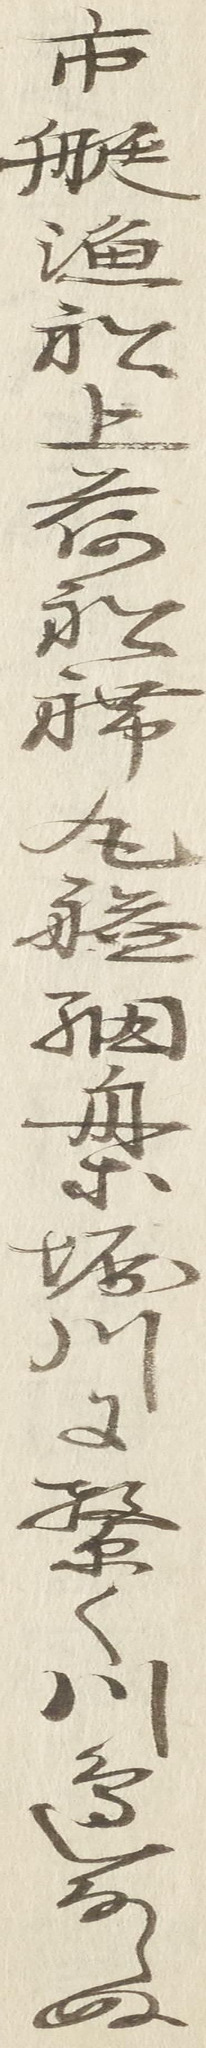市艇漁船上荷船艜丸？？舟等堀川に繋く川辺ならぬ
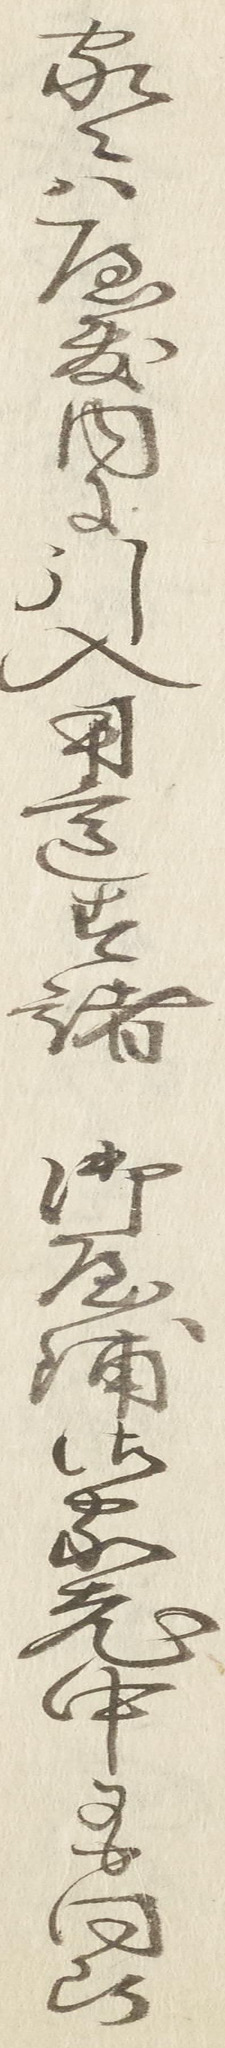家々は屋敷内に引入用意す諸御家鋪御家老中にも同断
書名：地震記　上
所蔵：東京大学地震研究所図書室 Earthquake Research Institute Library, The University of Tokyo, JAPAN
